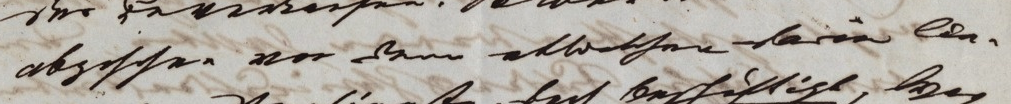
abgesehen von dem etwelchen darin lie-
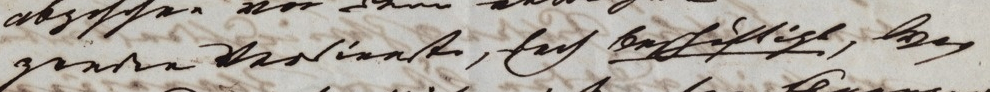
genden Verdienste, doch beschäftigt, was
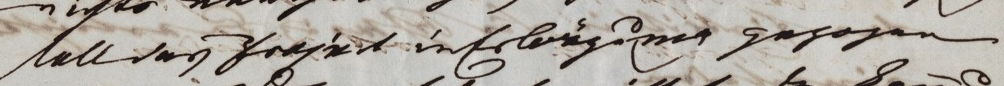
soll das Project in Erwägung gezogen
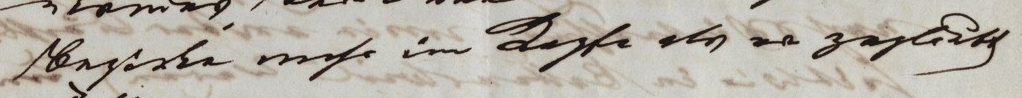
Bezirke mehr im Kopfe als er geglaubt
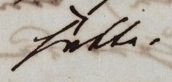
hätte.
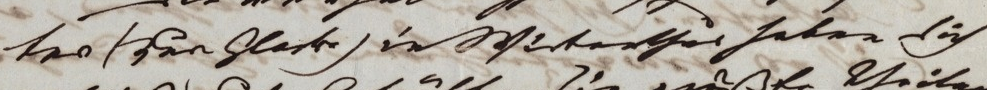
ter (zur Glocke) in Winterthur haben Dich
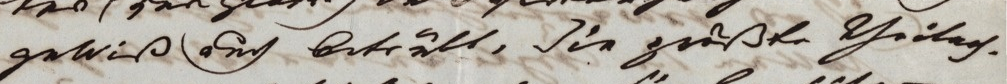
gewiß auch betrübt, die gößte Theilnah-
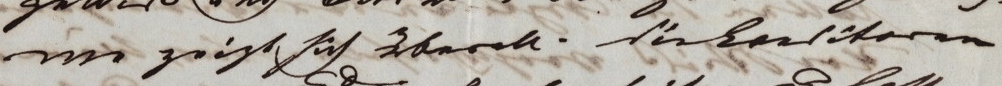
me zeigt sich überall. Die Creditoren
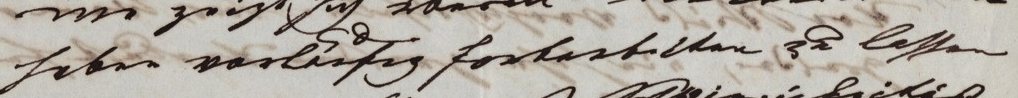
haben vorläufig fortarbeiten zu lassen
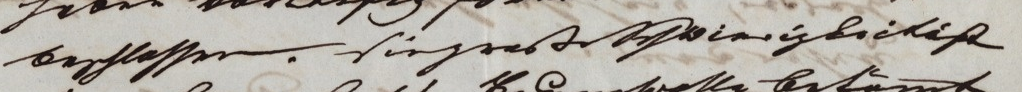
beschlossen. Die große Schwierigkeit ist
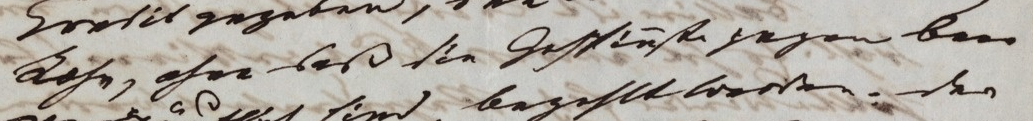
Lohn, ohne daß die Gespinnste gegen baar
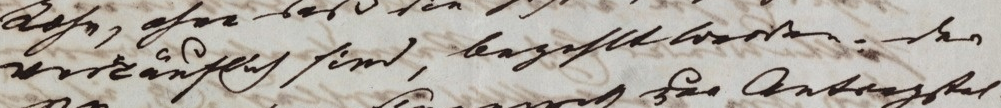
verkäuflich sind, bezahlt werden. Der
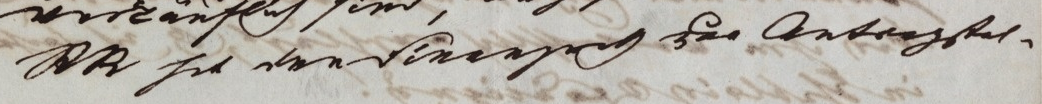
RR hat den Finanzrath zur Antragstel-
